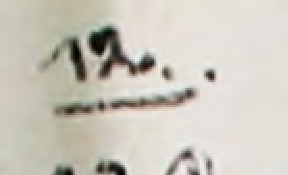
12.
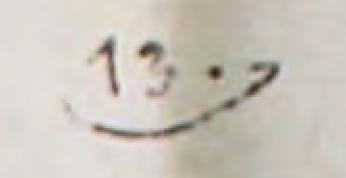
13.
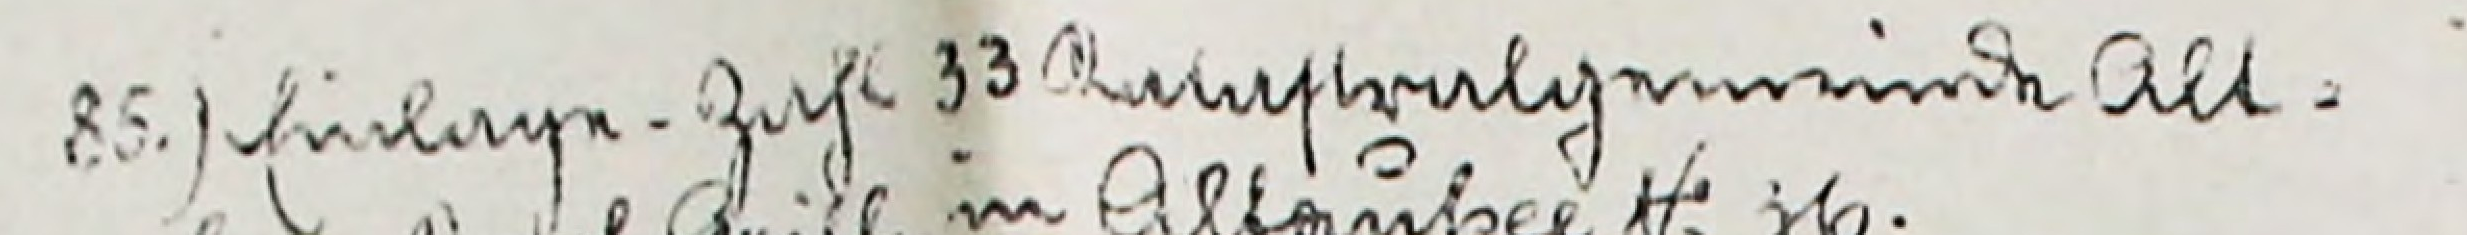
85.) Einlage - Zahl 33 Katastralgemeinde Alt=
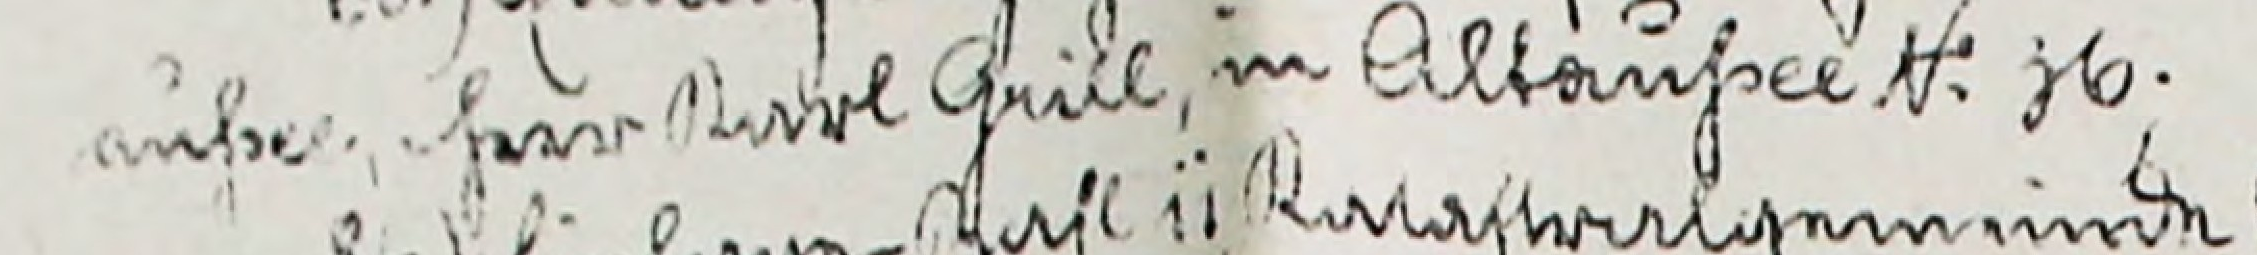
aussee, Herr Karl Grill, in Altaussee № 36;
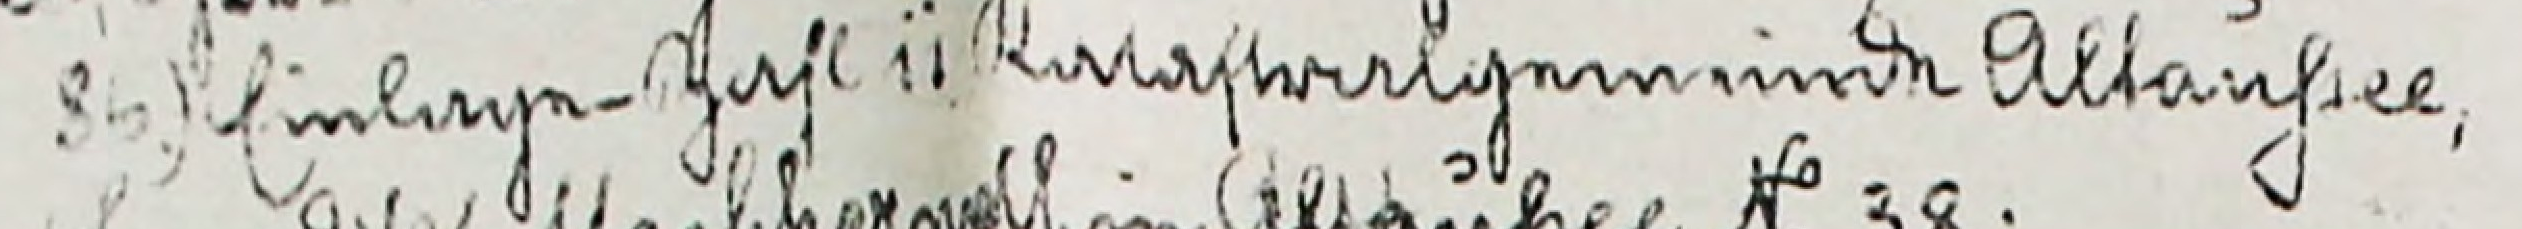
86.) Einlage - Zahl 11 Katastralgemeinde Altaussee,
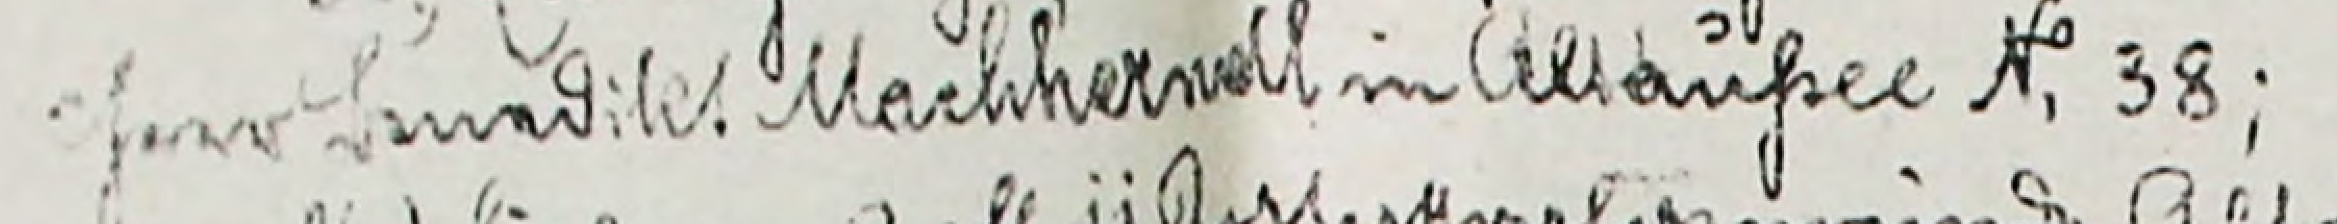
Herr Benedikt Machherndl in Altaussee № 38;
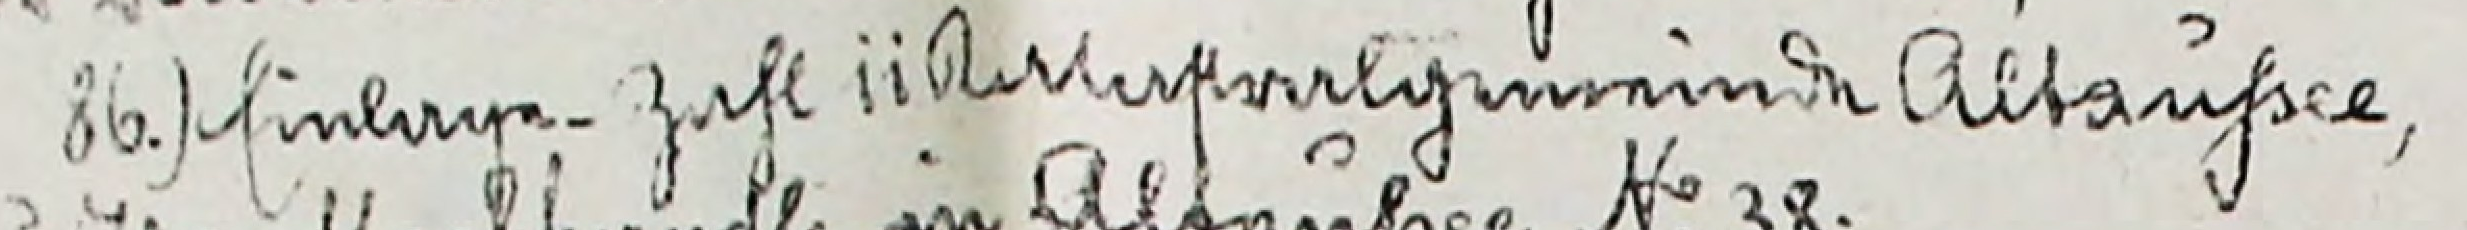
86.) Einlage - Zahl 11 Katastralgemeinde Altaussee,
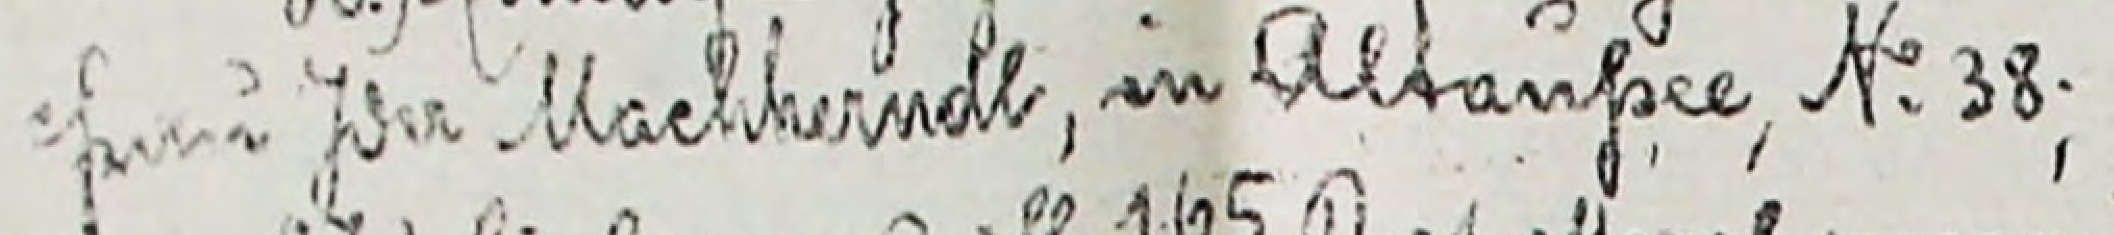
Frau Ida Machherndl, in Altaussee, № 38;
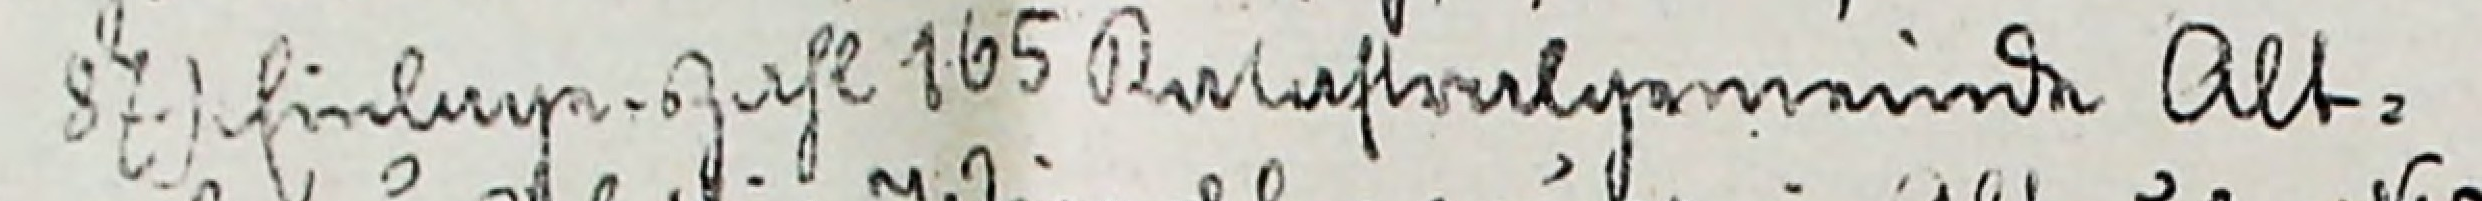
87.) Einlage - Zahl 165 Katastralgemeinde Alt=
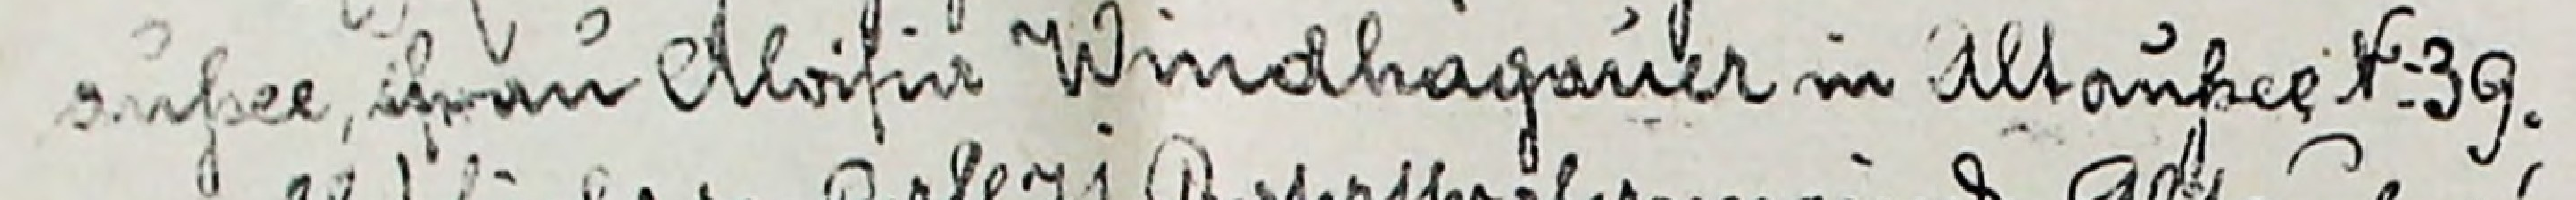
aussee, Frau Aloisia Windhagauer in Altaussee № 39;
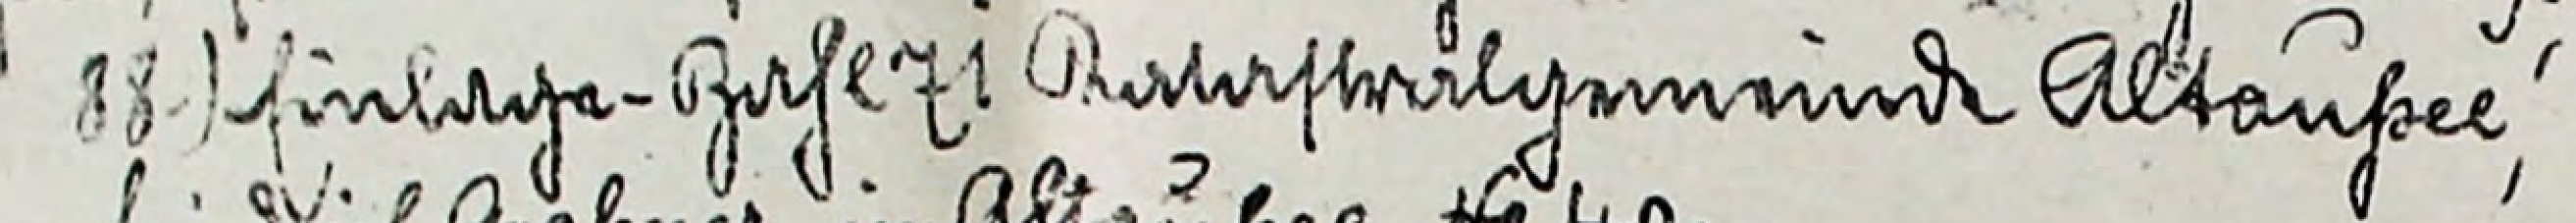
88.) Einlage - Zahl 71 Katastralgemeinde Altaussee,
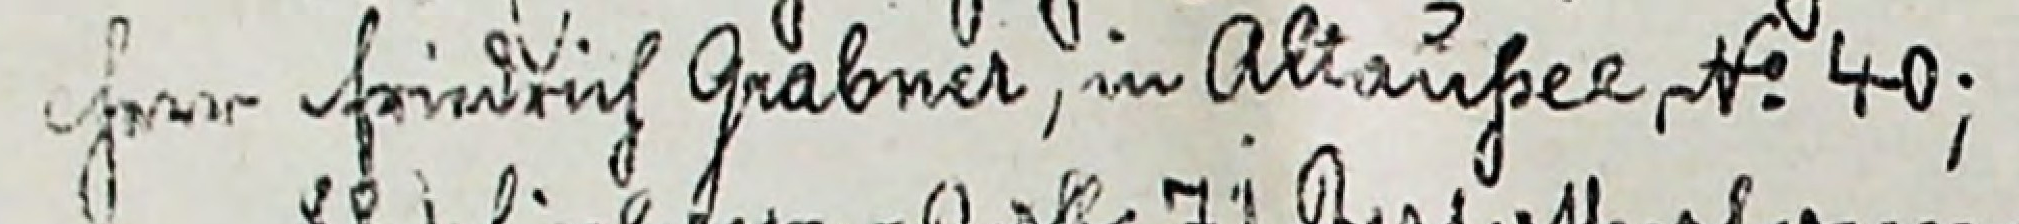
Herr Friedrich Grabner, in Altaussee, № 40;
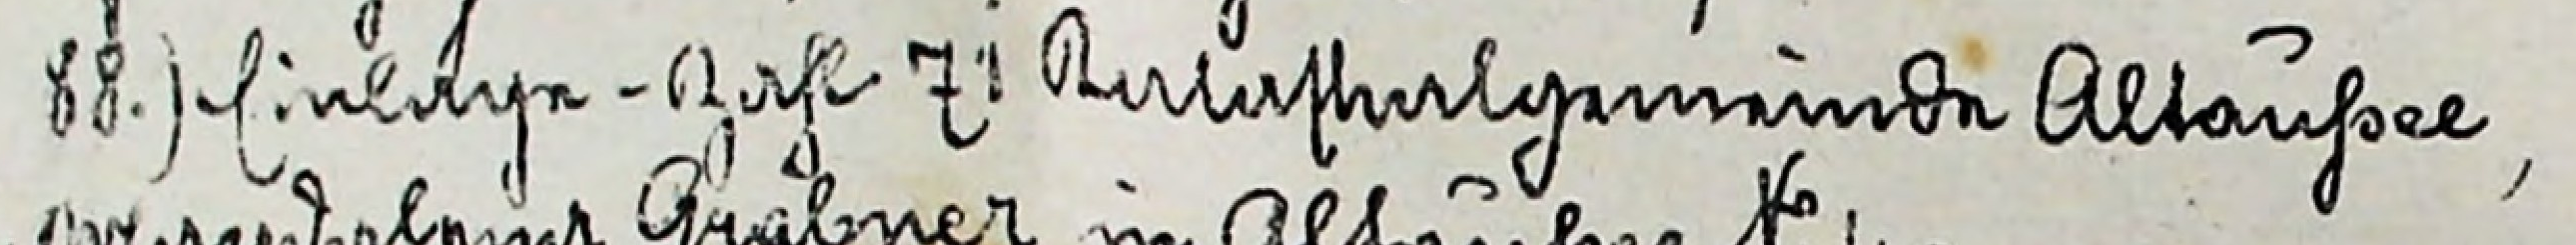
88.) Einlage - Zahl 71 Katastralgemeinde Altaussee,
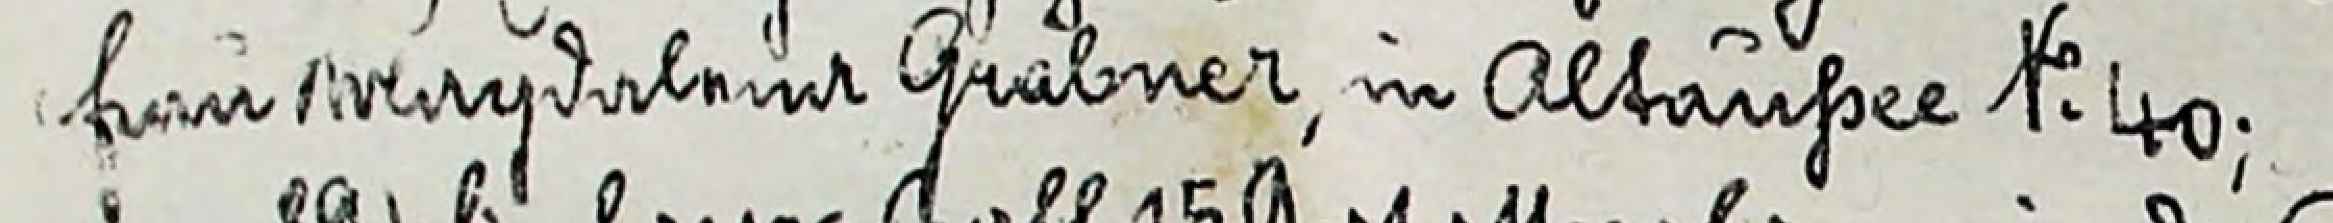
Frau Magdalena Grabner, in Altaussee № 40;
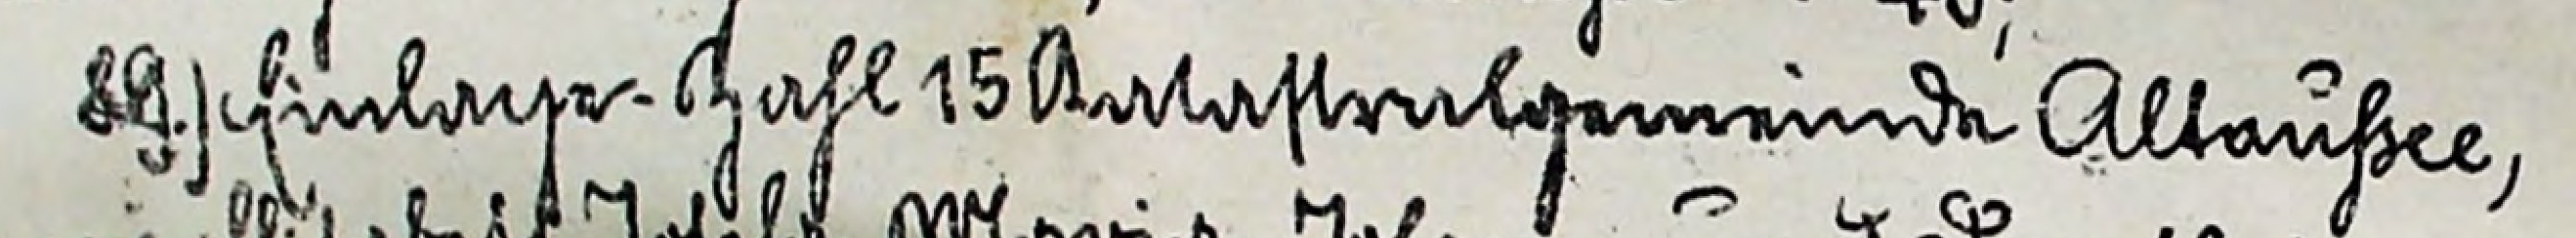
89.) Einlage - Zahl 15 Katastralgemeinde Altaussee,
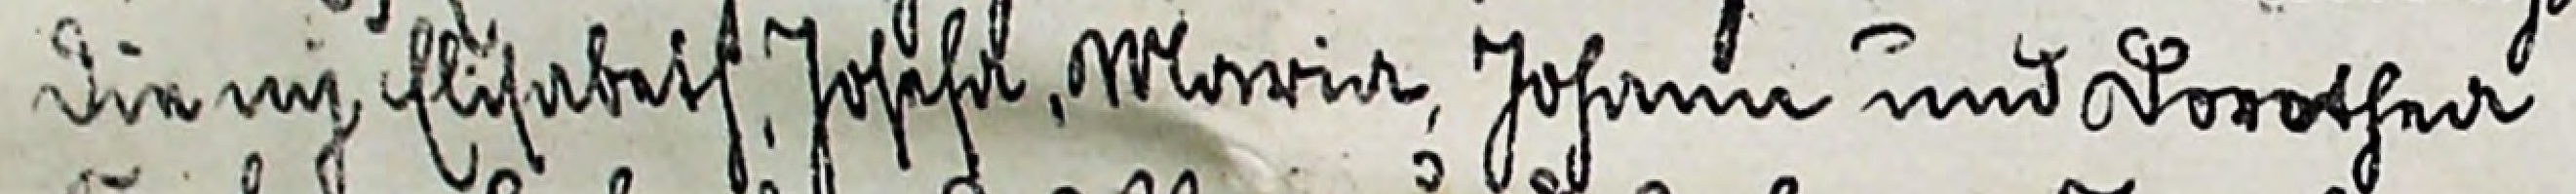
Die mj Elisabeth, Josefa, Maria, Johann und Dorothea
